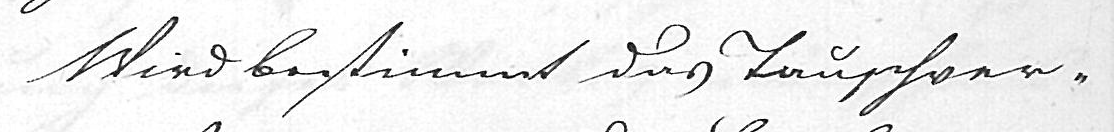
Wird bestimmt das Tauschver-
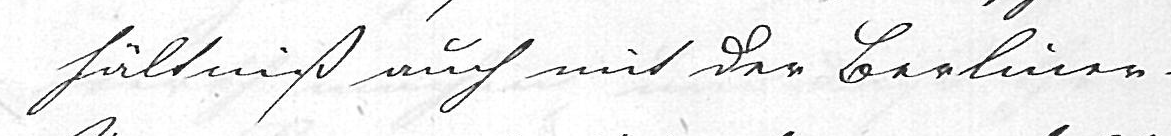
hältniß auch mit der Berliner-
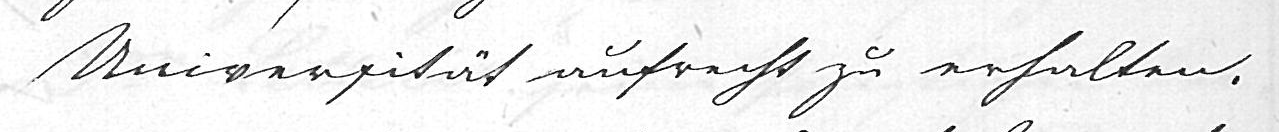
Universität aufrecht zu erhalten.
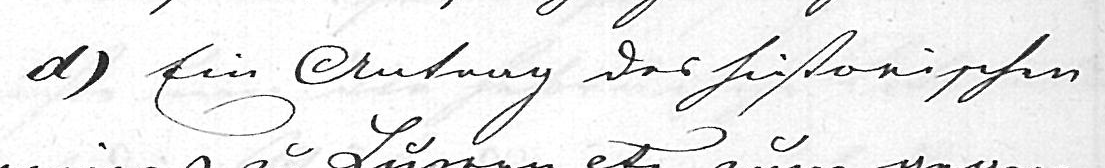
d) Ein Antrag des historischen
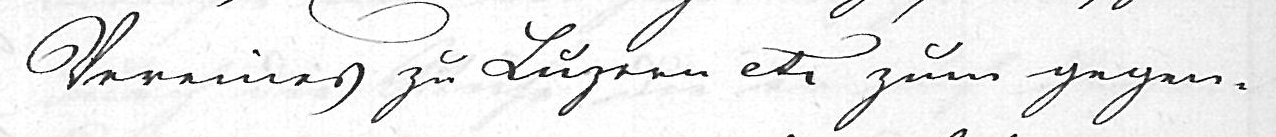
Vereines zu Luzern etc. zum gegen-
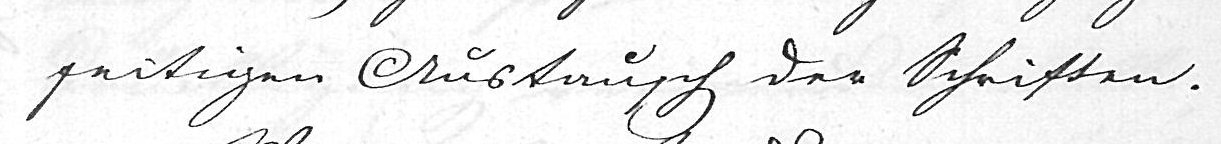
seitigen Austausch der Schriften.
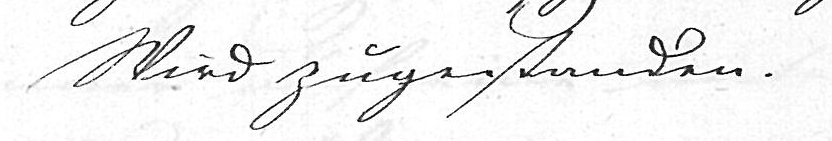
Wird zugestanden.
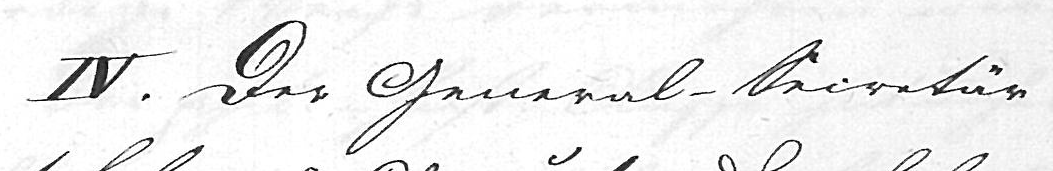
IV. Der General-Secretär
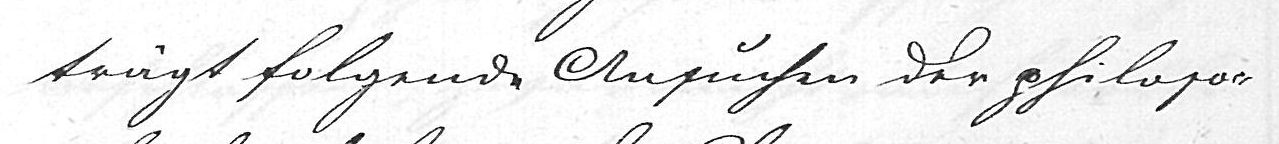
trägt folgende Ansuchen der philoso-
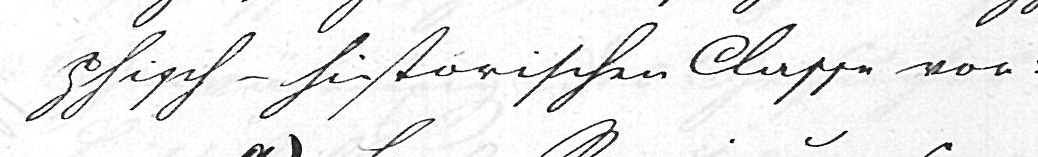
phisch-historischen Classe vor:
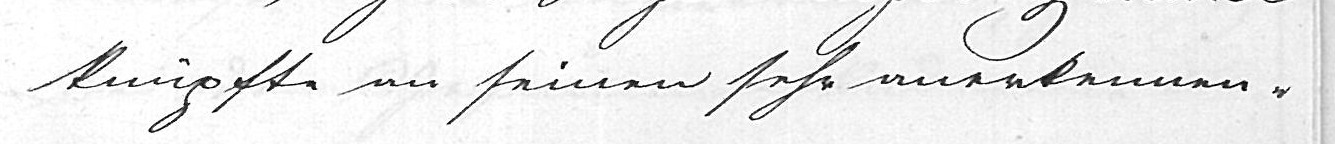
a) Herr Regierungsrath Chmel
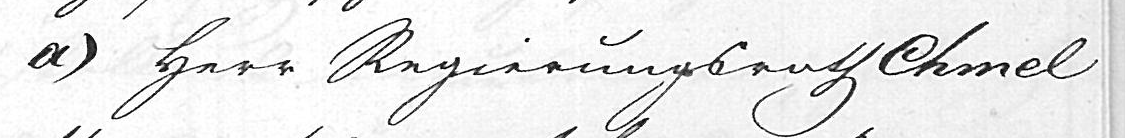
knüpfte an seinen sehr anerkennen-
